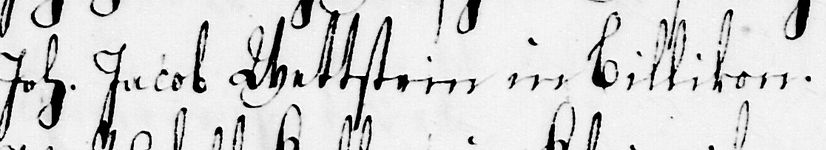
Joh. Jacob Wettstein in Billikon.
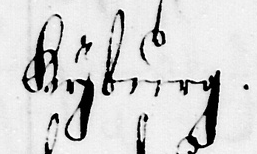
Kyburg
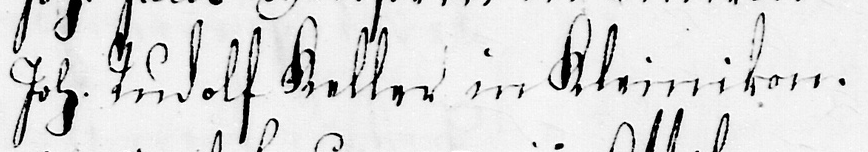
Joh. Rudolf Keller in Kleinikon.
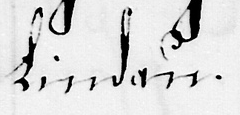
Lindau
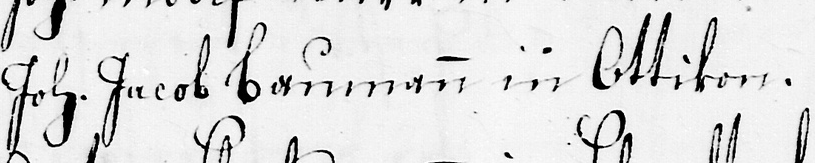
Joh. Jacob Baumann in Ottikon.
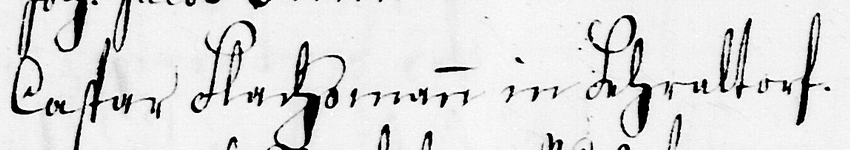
Caspar Flachsmann in Fehraltorf.
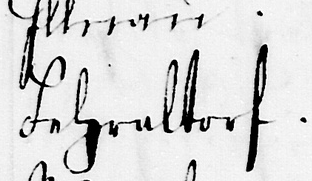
Fehraltorf
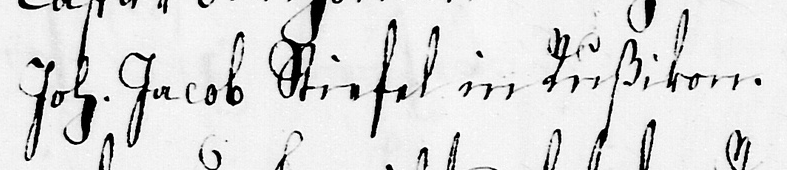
Joh. Jacob Stiefel in Rußikon.
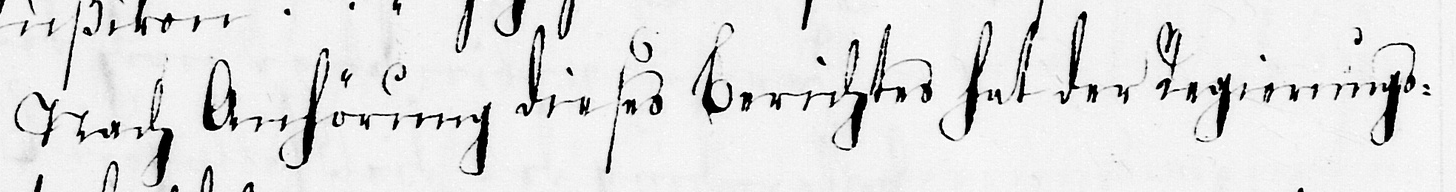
Nach Anhörung dieses Berichtes hat der Regierungs¬
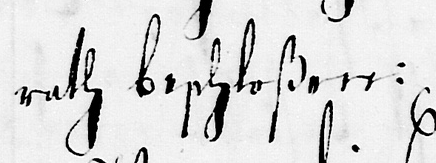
rath beschloßen:
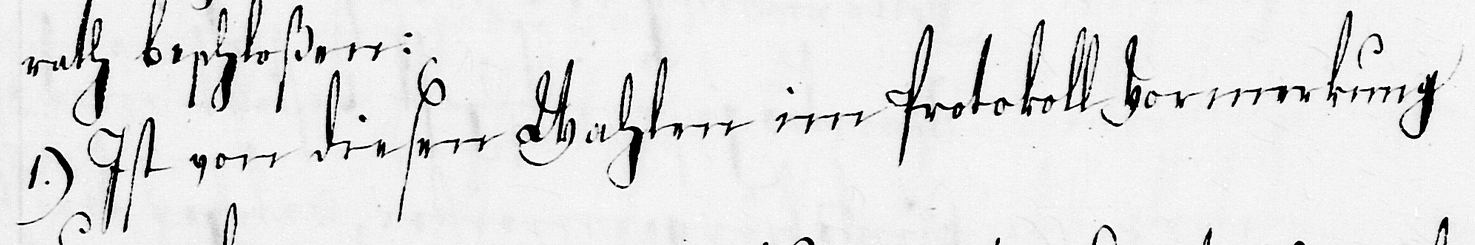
1.) Ist von diesen Wahlen im Protokoll Vormerkung
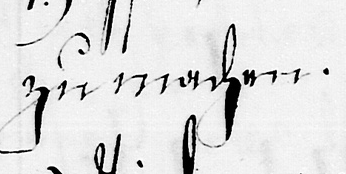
zu machen.
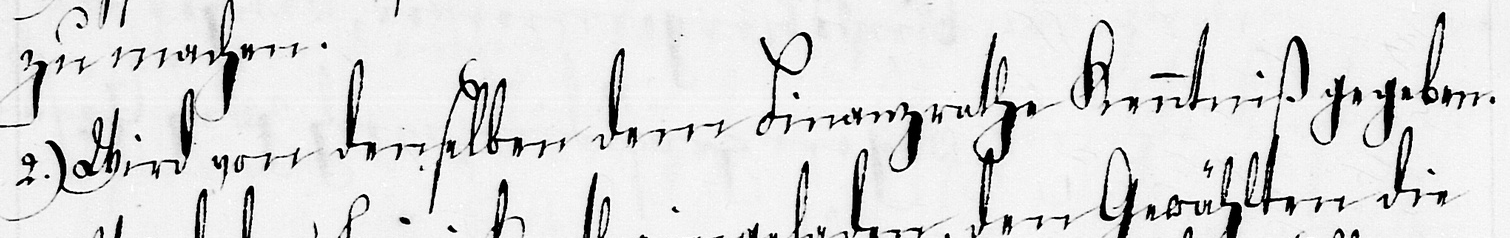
2.) Wird von denselben dem Finanzrathe Kenntniß gegeben.
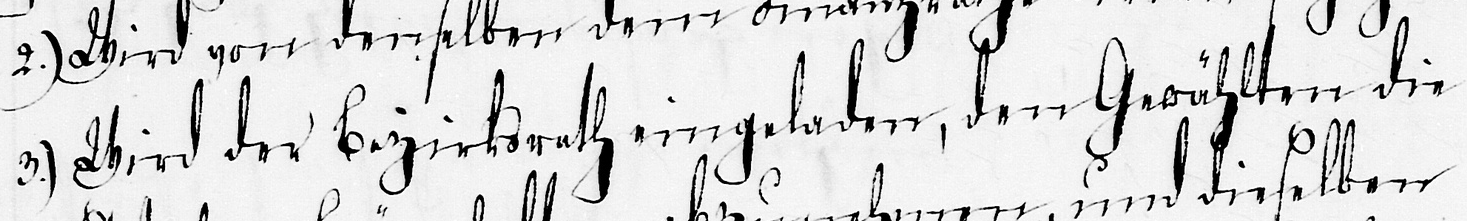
3.) Wird der Bezirksrath eingeladen, den Gewählten die
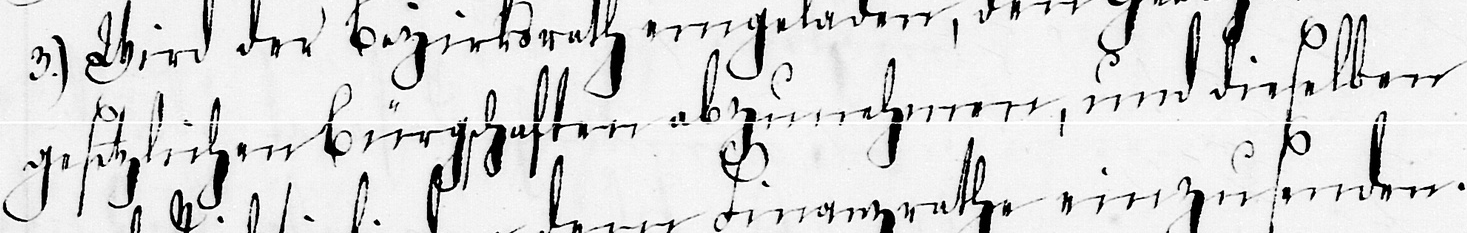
gesetzlichen Bürgschaften abzunehmen, und dieselben
